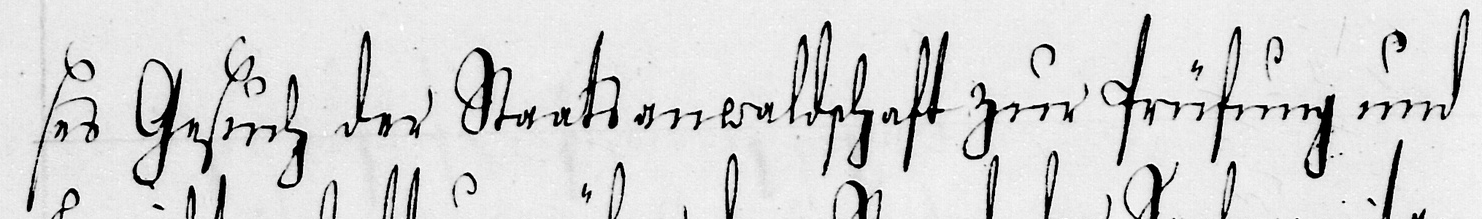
ses Gesuch der Staatsanwaldschaft zur Prüfung und
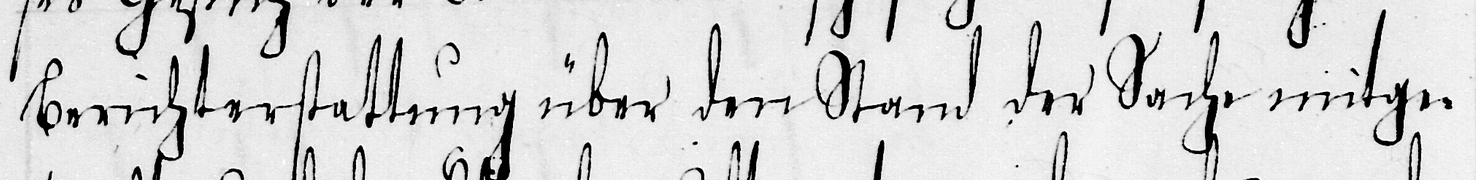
Berichterstattung über den Stand der Sache mitge¬
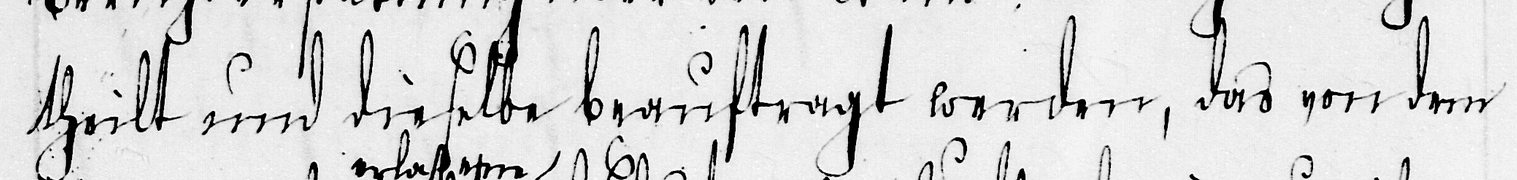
theilt und dieselbe beauftragt werden, das von dem
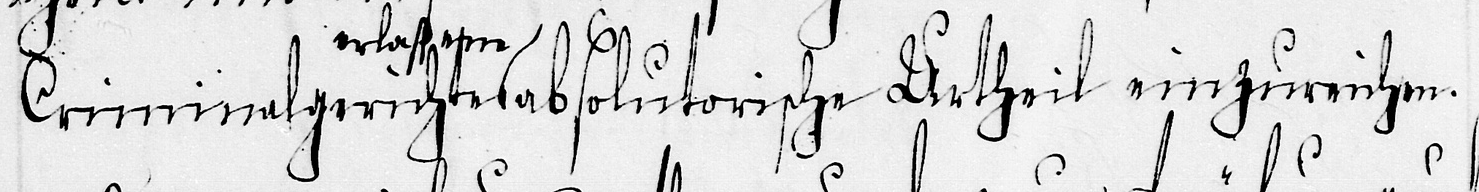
Criminalgerichte erlaßene absolutorische Urtheil einzureichen.
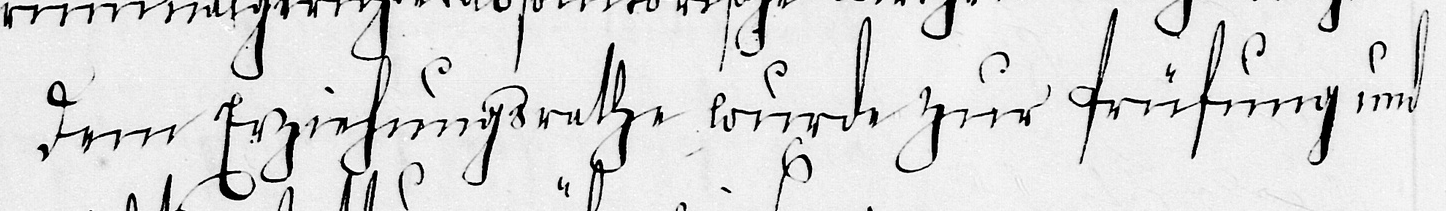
Dem Erziehungsrathe wurde zur Prüfung und
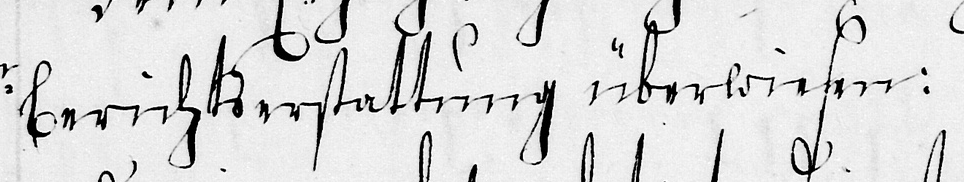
Berichtserstattung überwiesen:
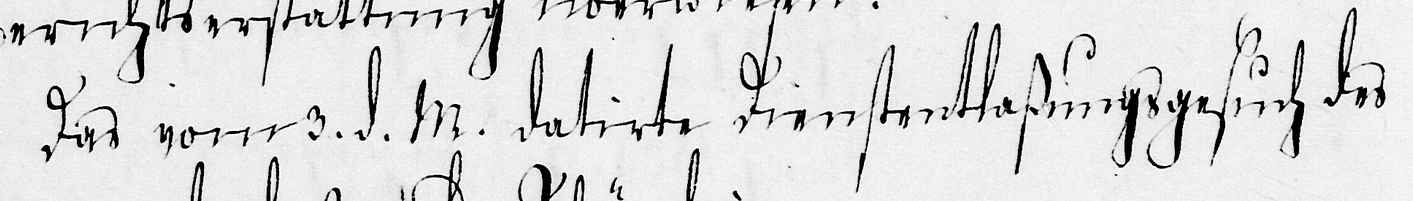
Das vom 3. d. M. datirte Dienstentlaßungsgesuch des
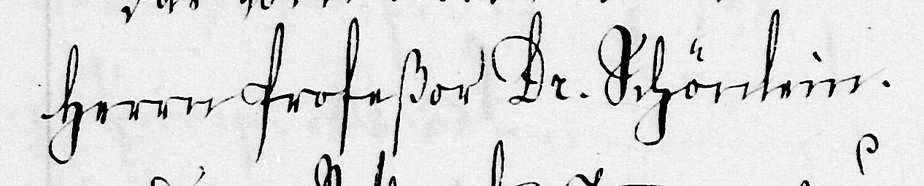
Herrn Profeßor Dr. Schönlein.
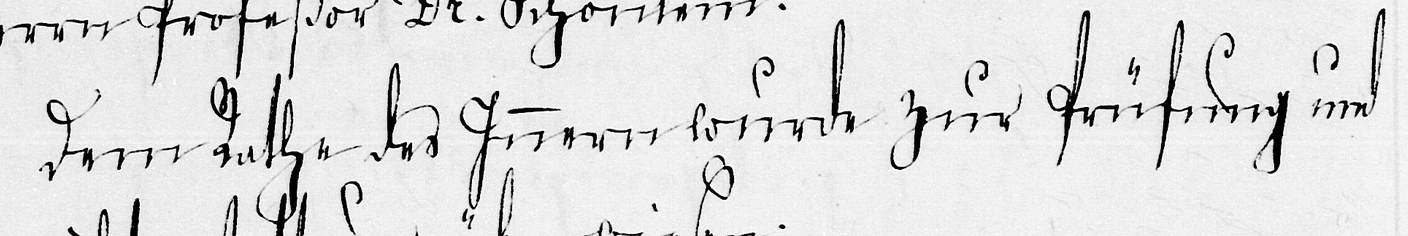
Dem Rathe des Innern wurde zur Prüfung und
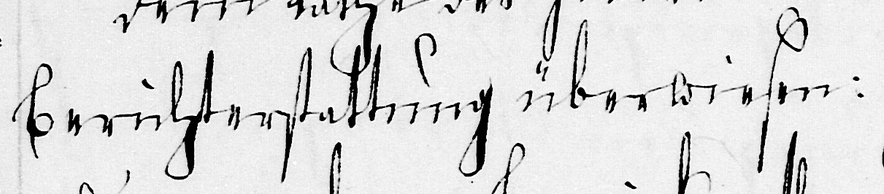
Berichterstattung überwiesen:
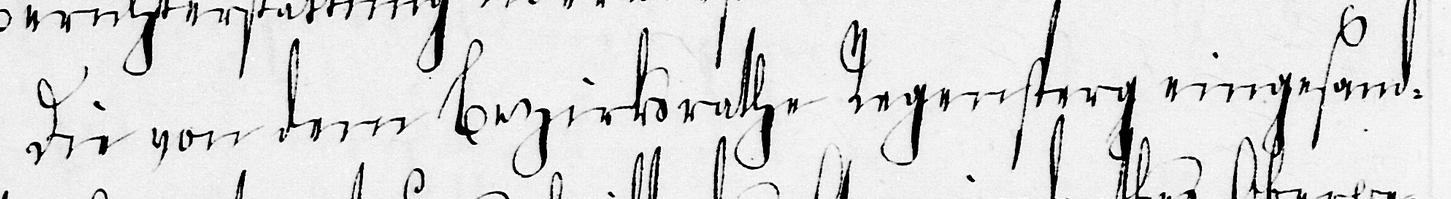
Die von dem Bezirksrathe Regensperg eingesand¬
